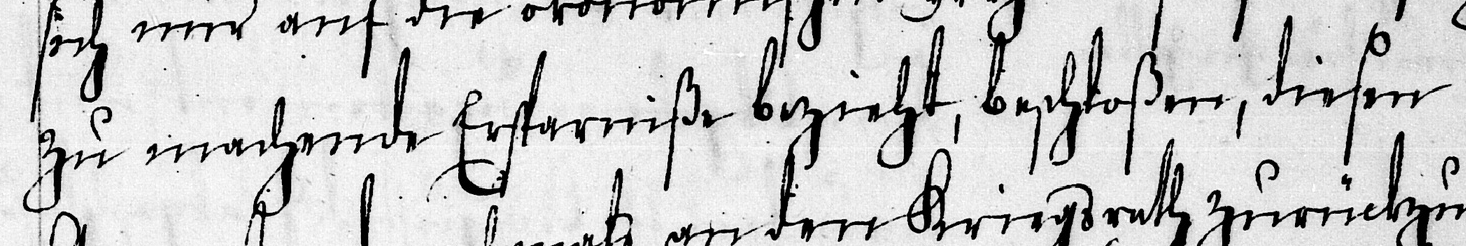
zu machende Ersparniße bezieht, beschloßen, diesen
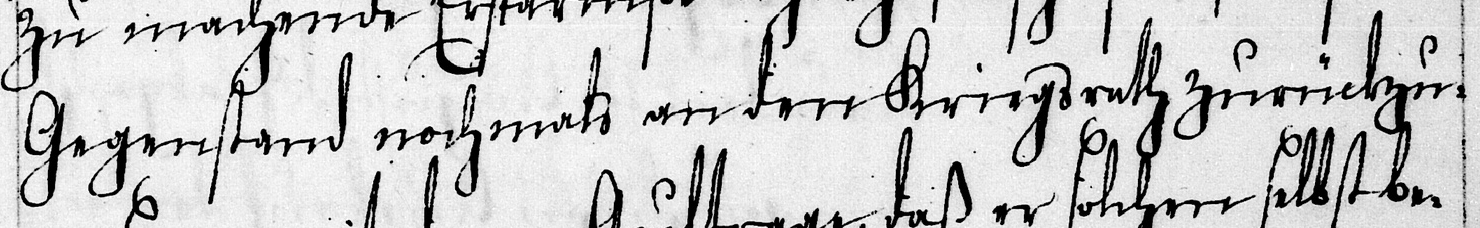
Gegenstand nochmals an den Kriegsrath zurückzu¬
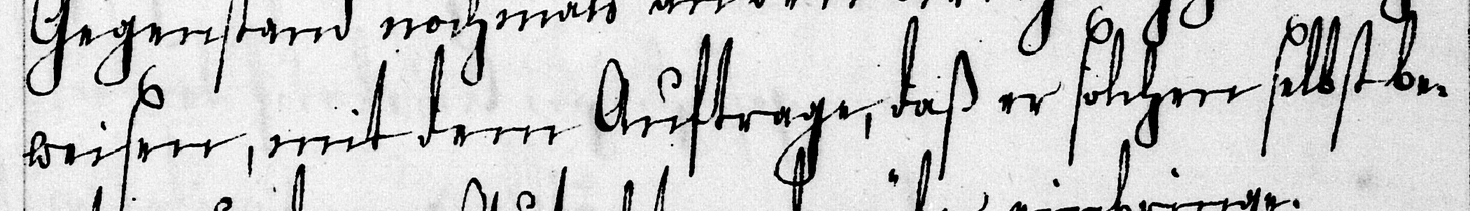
weisen, mit dem Auftrage, daß er solchen selbst b¬
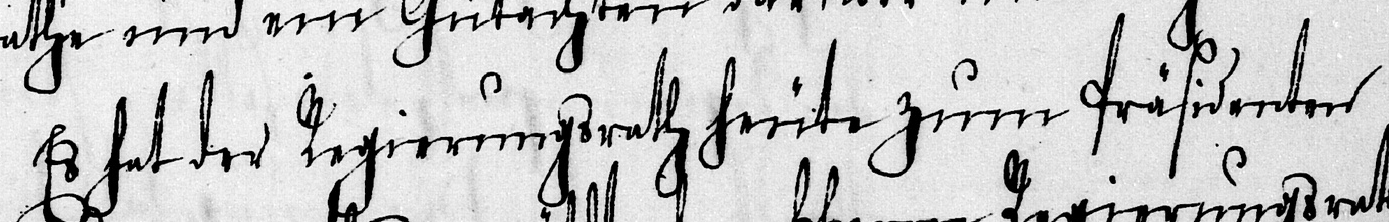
Es hat der Regierungsrath heute zum Präsidenten
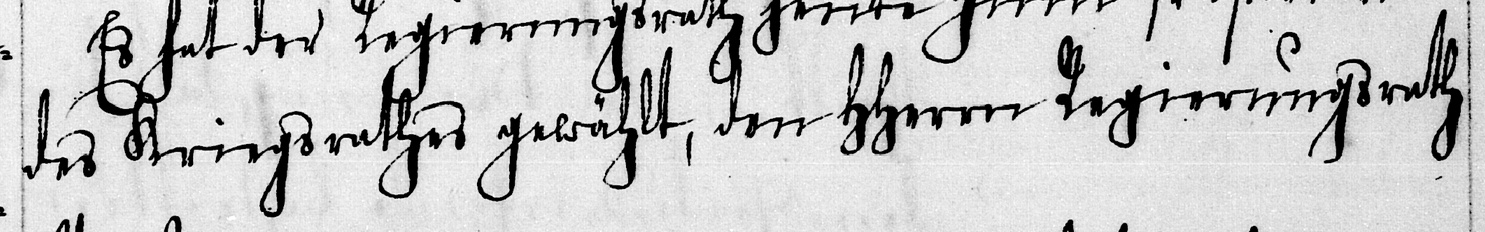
des Kriegsrathes gewählt, den HHerrn Regierungsrath
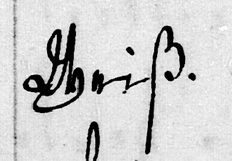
Weiß.
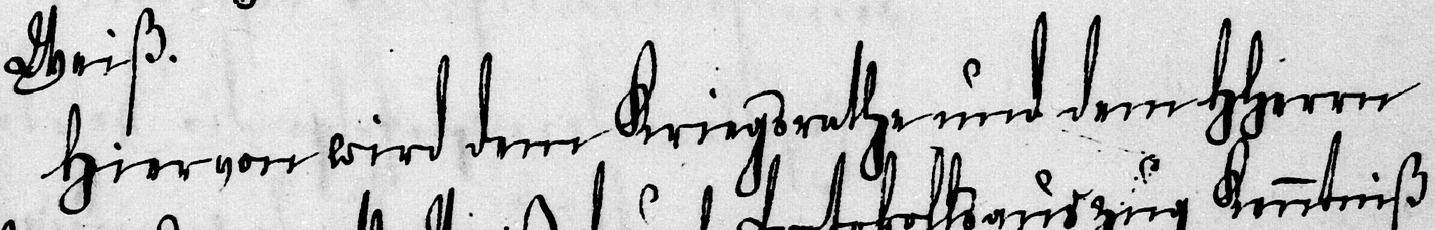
Hiervon wird dem Kriegsrathe und dem HHerrn
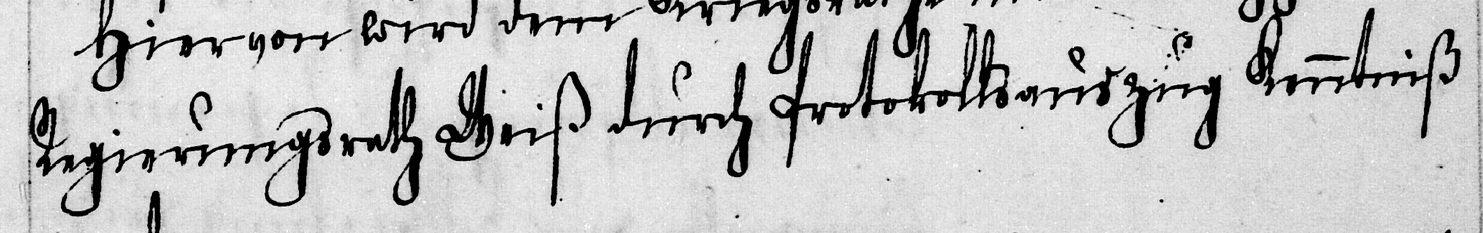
Regierungsrath Weiß durch Protokollsauszug Kenntniß
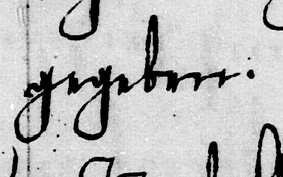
gegeben.
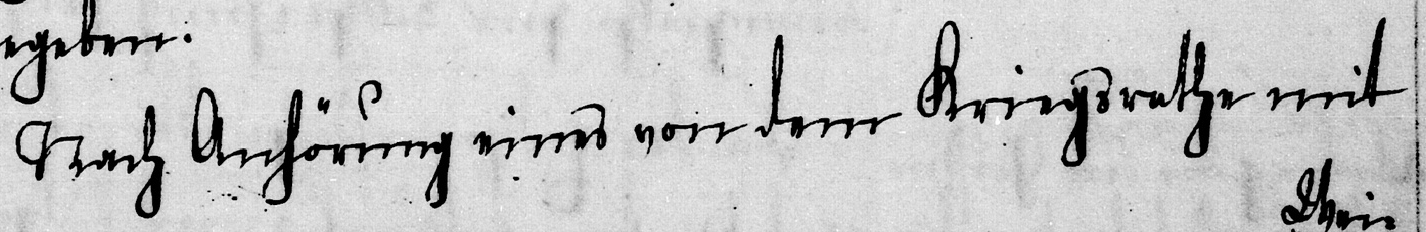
Nach Anhörung eines von dem Kriegsrathe mit
